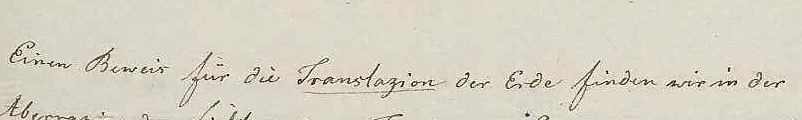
Einen Beweis für die Translazion der Erde finden wir in der
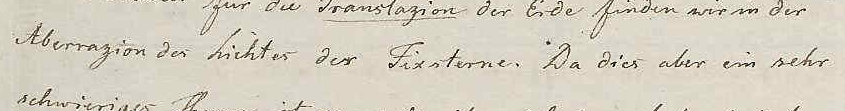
Aberrazion des Lichtes der Fixsterne. Da dies aber ein sehr
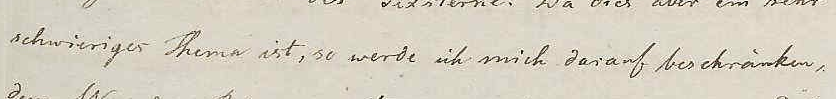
schwieriges Thema ist, so werde ich mich darauf beschränken,
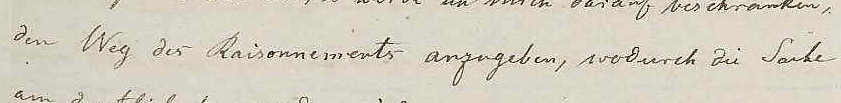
den Weg des Raisonnements anzugeben, wodurch die Sache
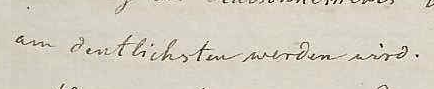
am deutlichsten werden wird.
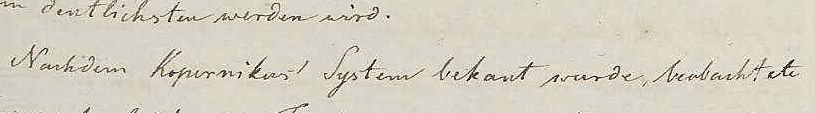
Nachdem Kopernikus' System bekannt wurde, beobachtete
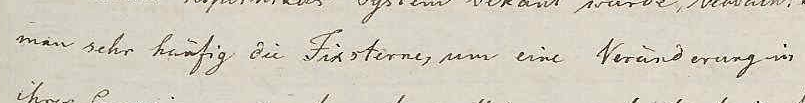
man sehr häufig die Fixsterne, um eine Veränderung in
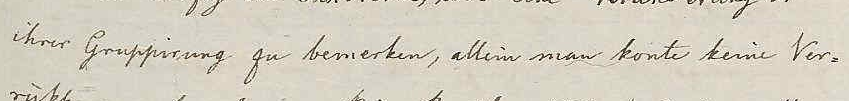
ihrer Gruppirung zu bemerken, allein man konte keine Ver-
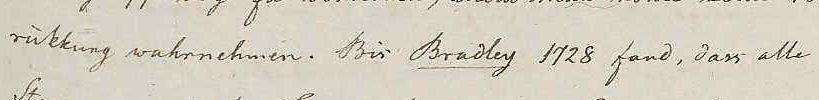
rükkung wahrnehmen. Bis Bradley 1728 fand, dass alle
